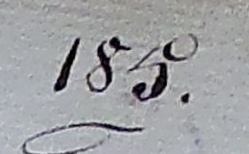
185.
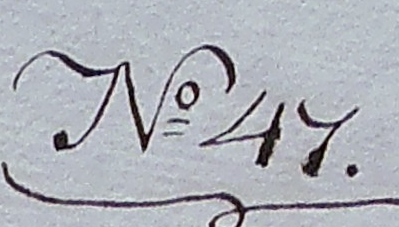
No͇ 47.
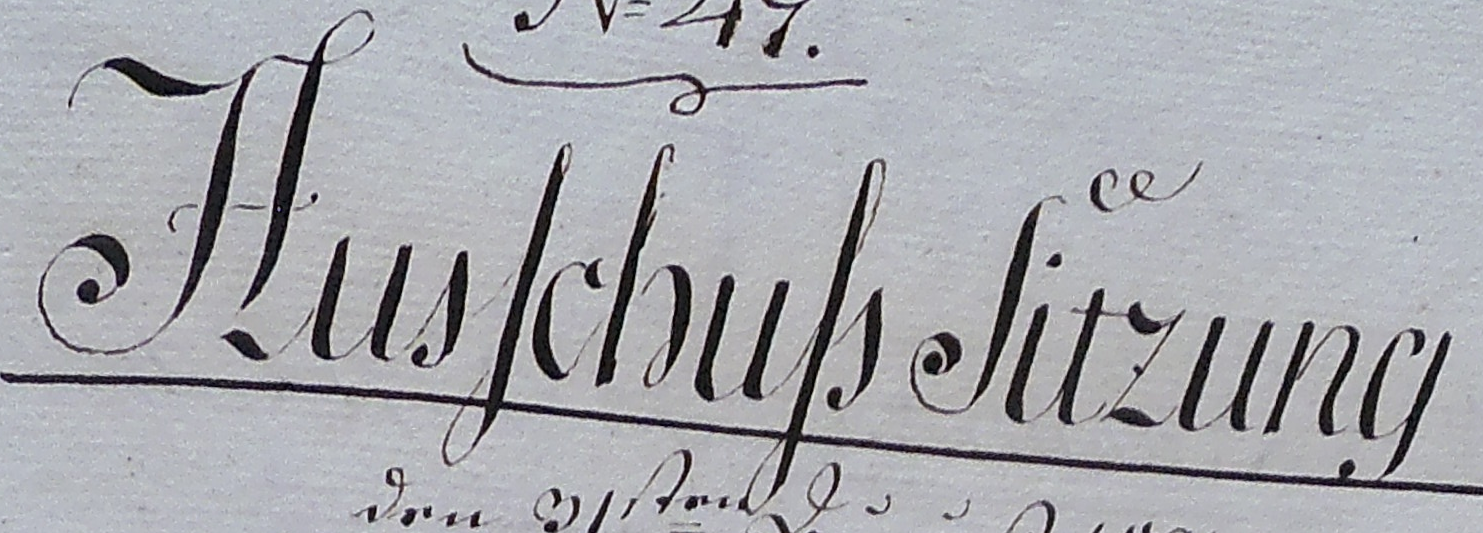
Ausschuss Sitzung
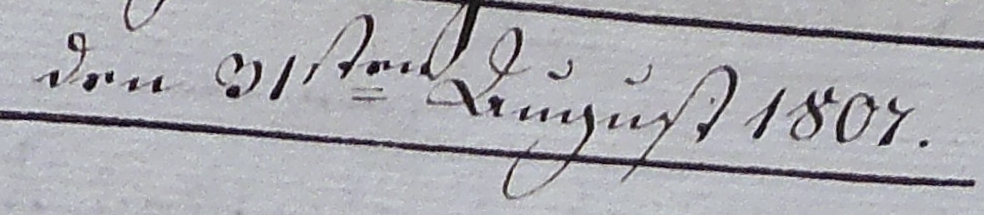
den 31ste͇n August 1807.
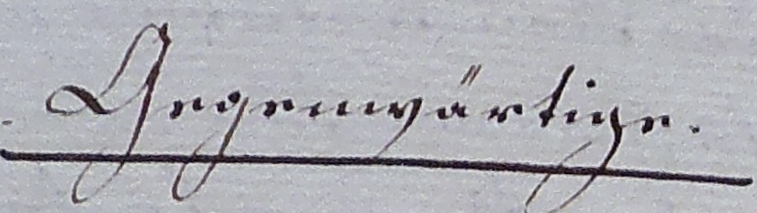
Gegenwärtige.
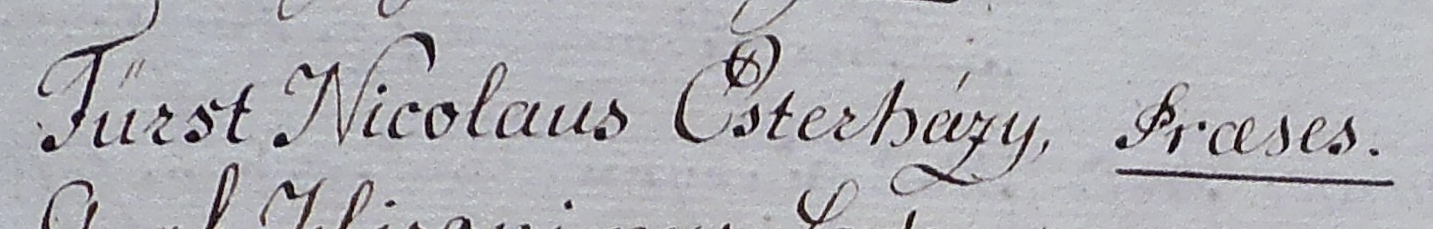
Fürst Nicolaus Esterházy Præses.
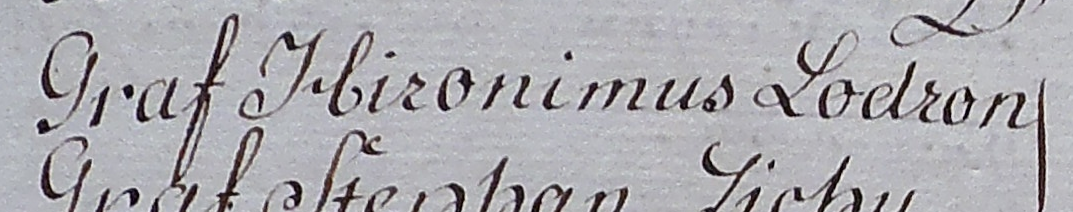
Graf Hironimus Lodron
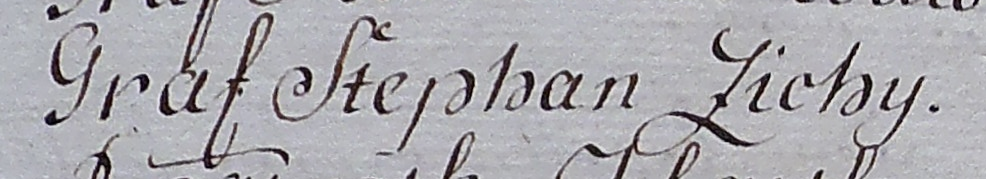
Graf Stephan Zichy.
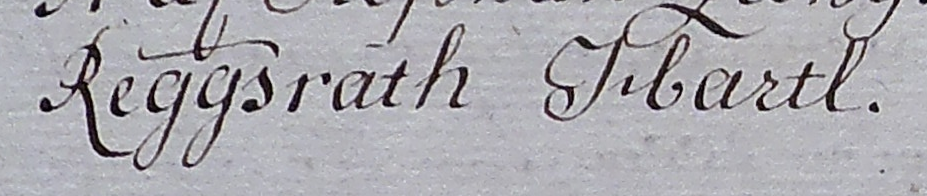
Reg͞gsrath Hartl.
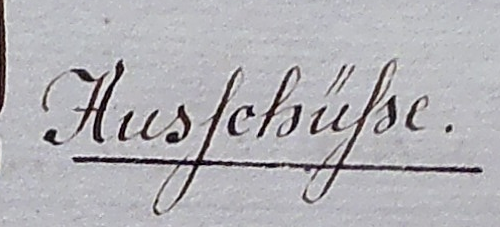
Ausschüsse.
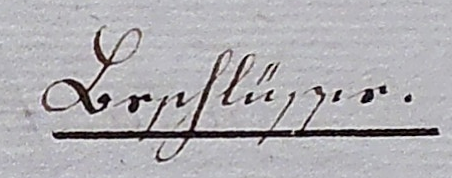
Beschlüsse.
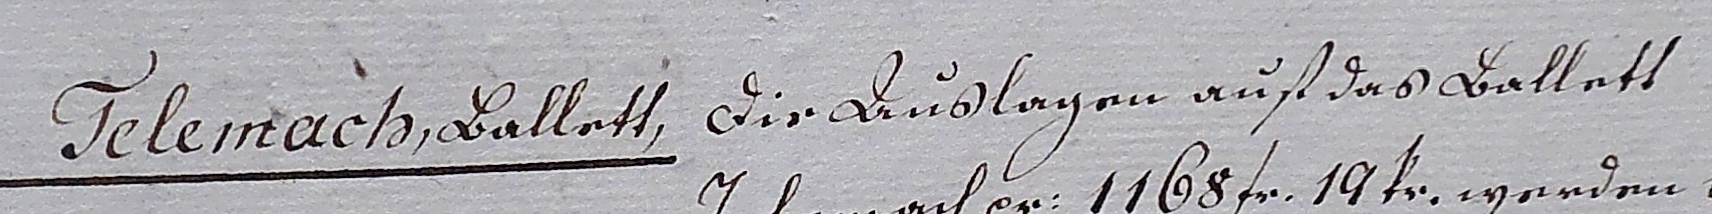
Telemach, Ballett, Die Auslagen auf das Ballett
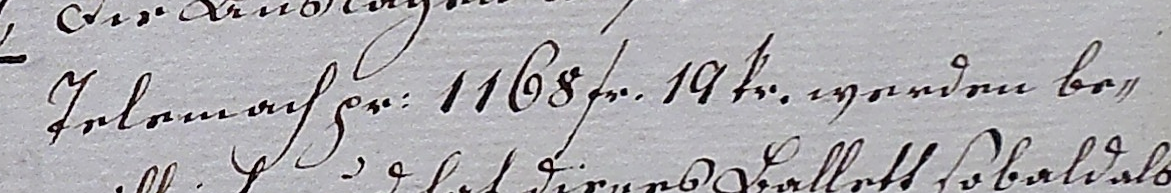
Telemach pr: 1168fr. 19kr. werden be¬
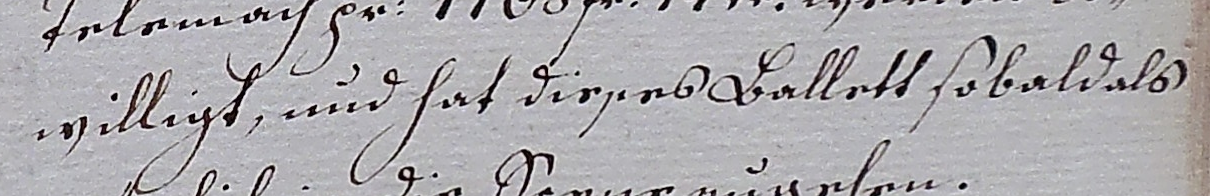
willigt, und hat dieses Ballett sobald als
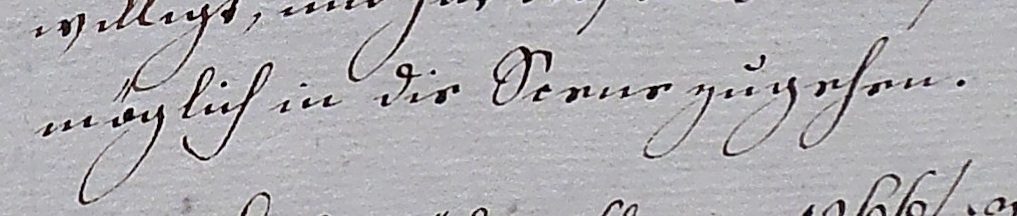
möglich in die Scene zugehen.
